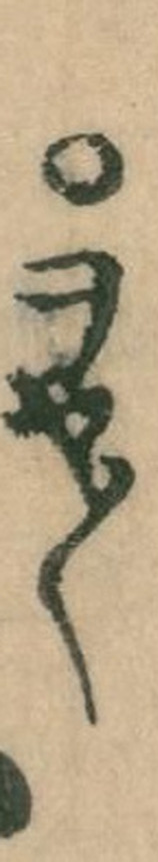◯ヲヤ〳〵
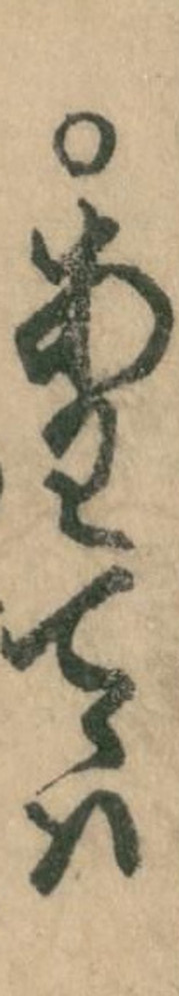◯あわてゝは
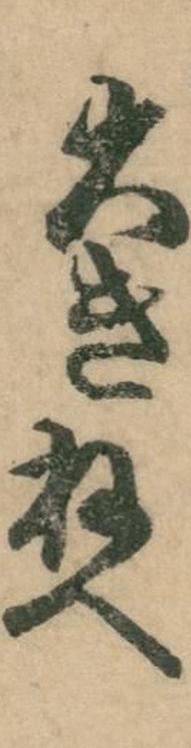大きねへ
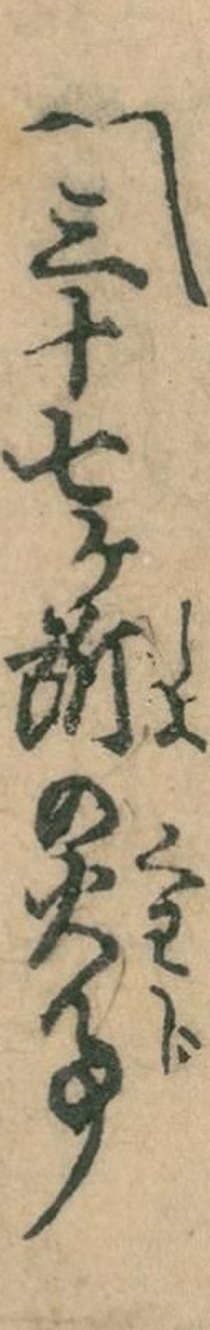〽三十七ヶ所の火事
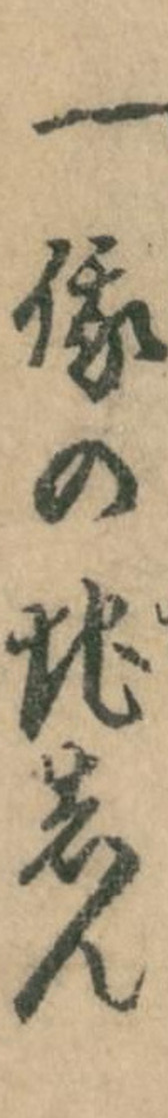〽俄の地しん
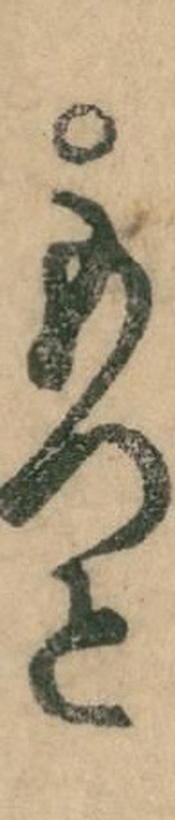◯もつと
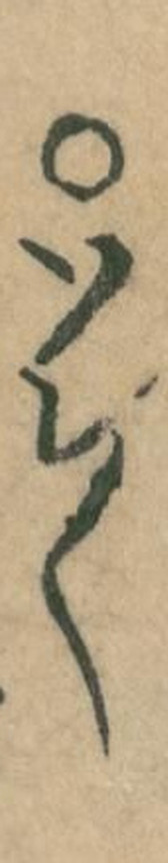◯ソレ〳〵
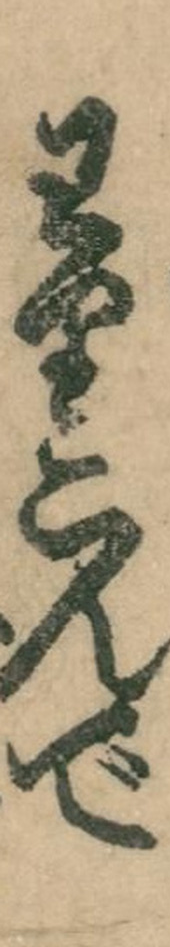わりこんで
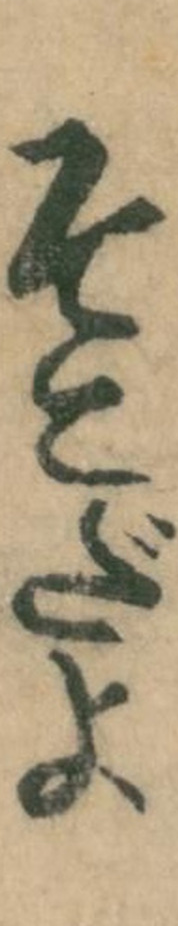そこだよ
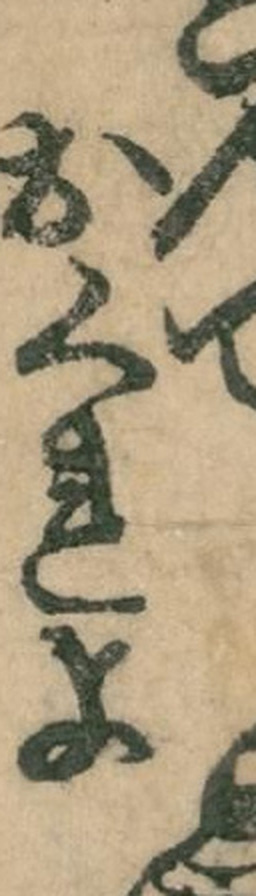おくれよ
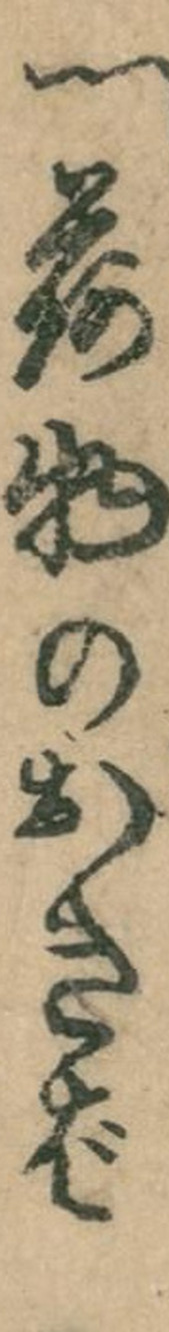〽荷物のおきば
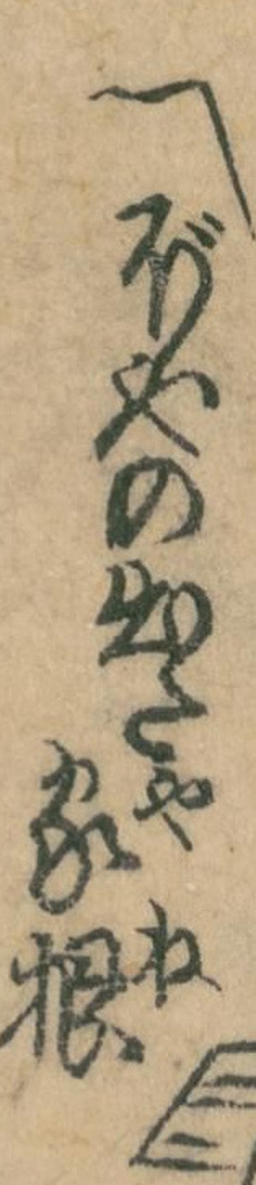〽ぼやの出た
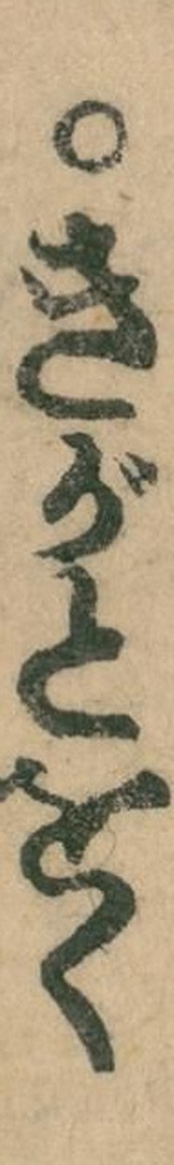◯きがとをく
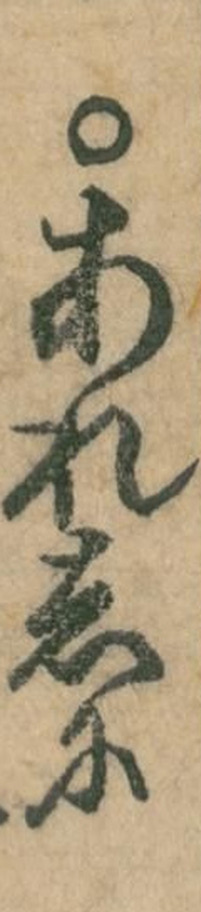◯あれしに
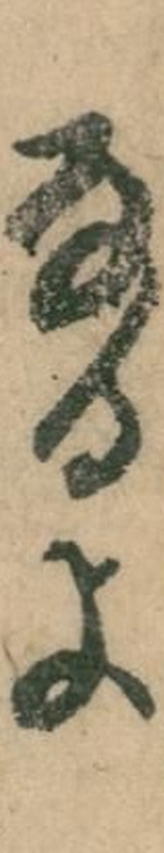なるよ
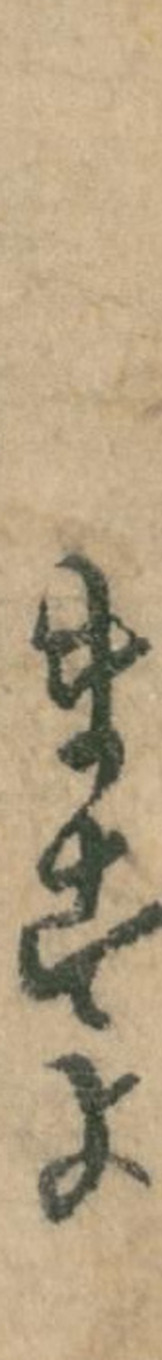ますよ
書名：地震出火　再度目のお笑ひ
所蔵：東京大学地震研究所図書室 Earthquake Research Institute Library, The University of Tokyo, JAPAN
